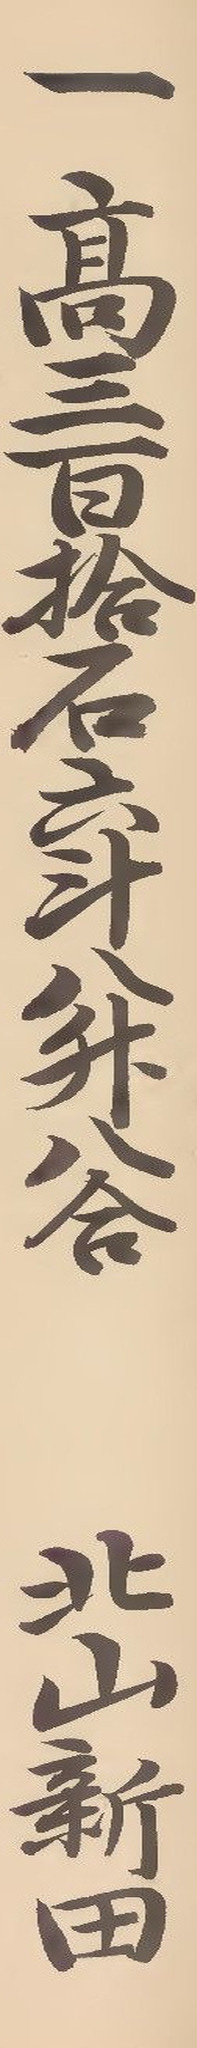一高三百拾石六斗八升八合北山新田
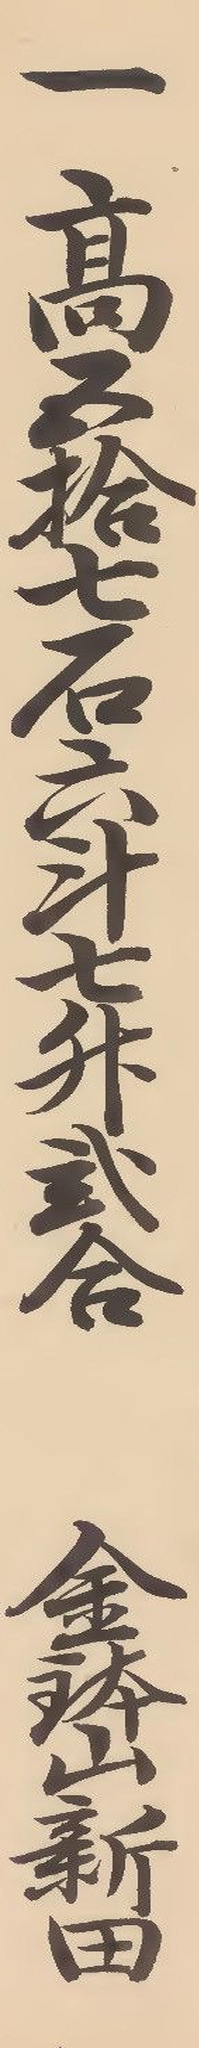一高五拾七石六斗七升弐合金鉢山新田
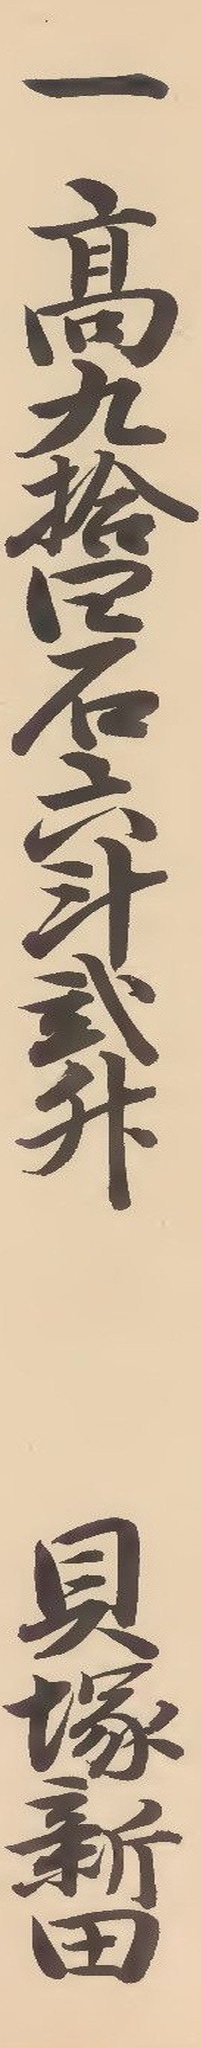一高九拾四石六斗弐升貝塚新田
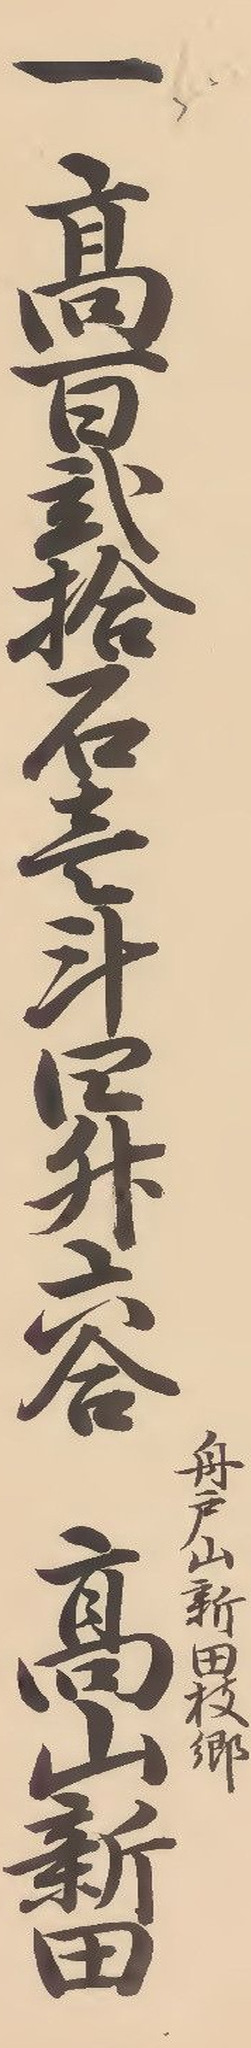一高百弐拾石壱斗四升六合高山新田

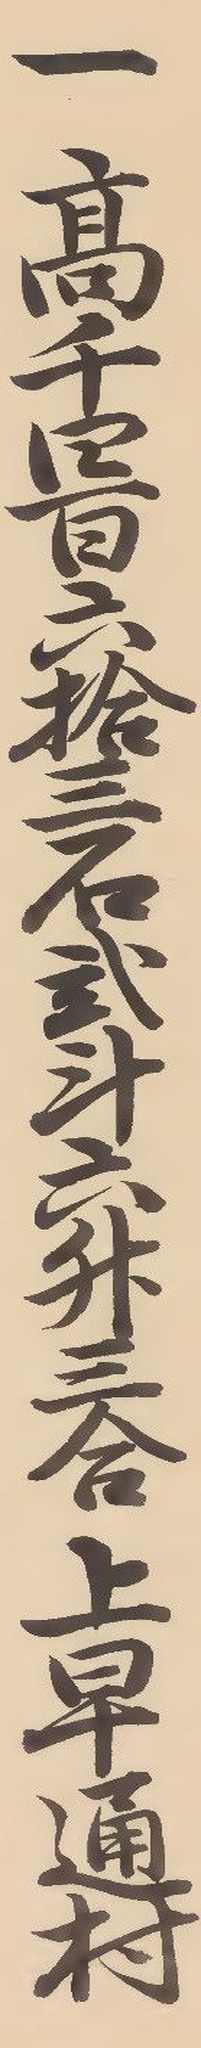一高千四百六拾三石弐斗六升三合上早通村
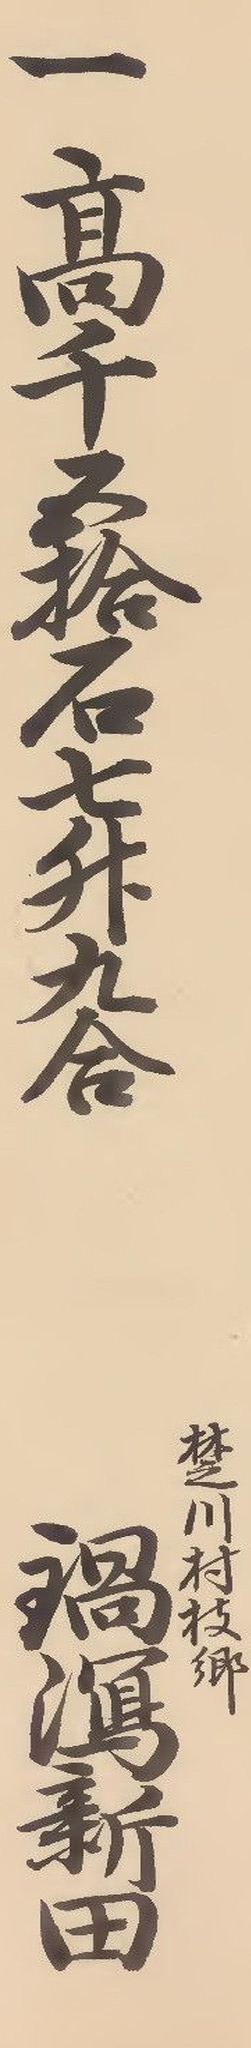一高千五拾石七升九合鍋潟新田
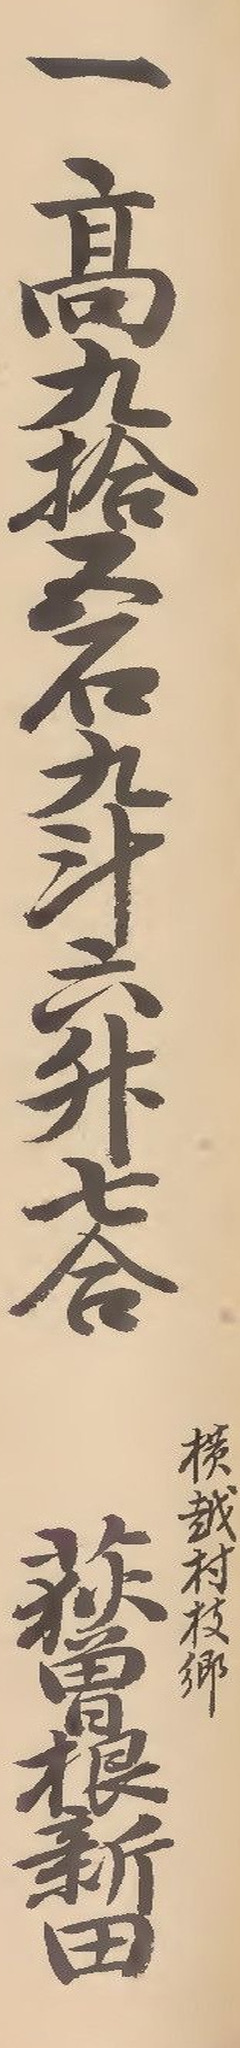一高九拾五石九斗六升七合荻曽根新田
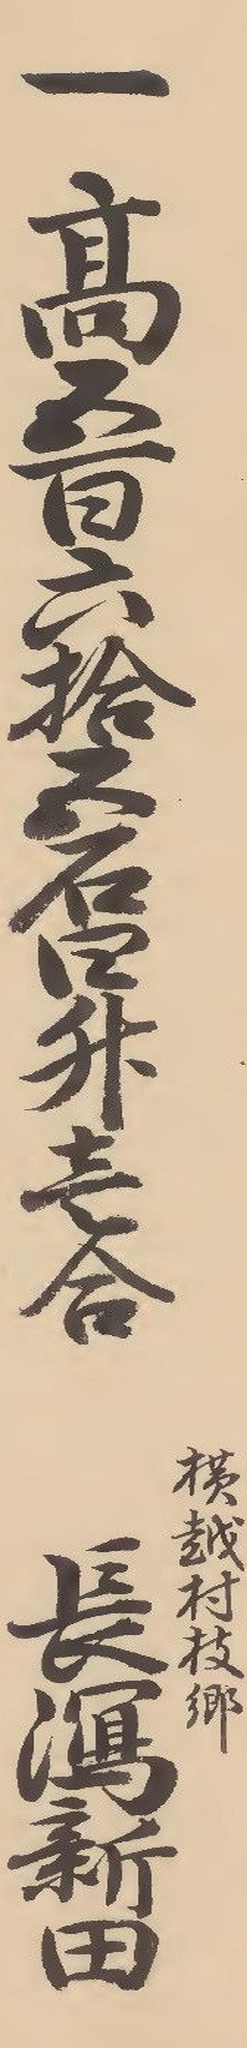一高五百六拾五石四升壱合長潟新田
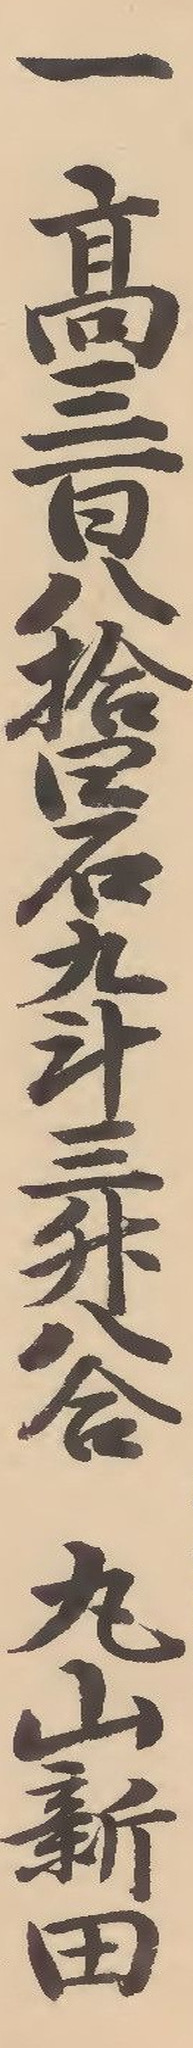一高三百八拾四石九斗三升八合丸山新田
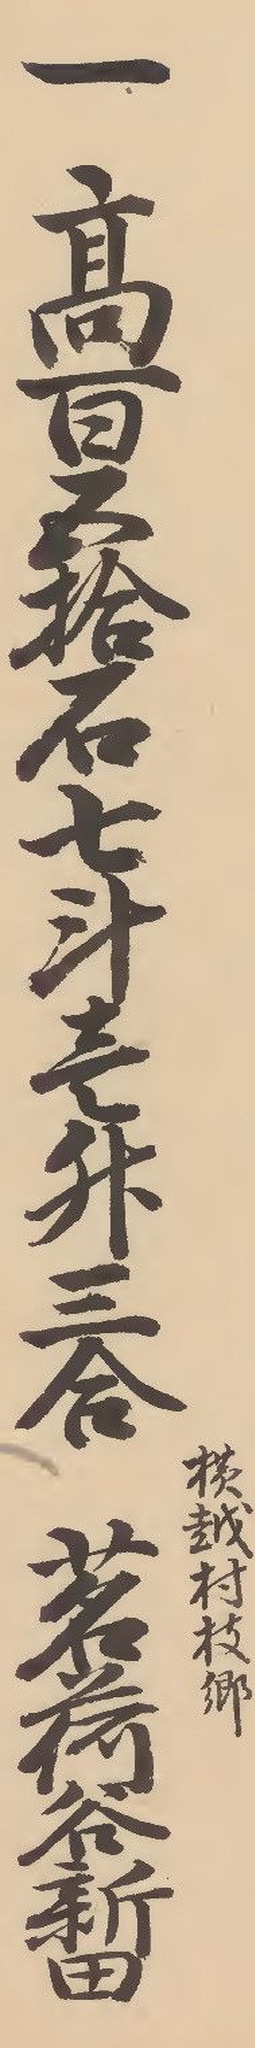一高百五拾石七斗壱升三合茗荷谷新田

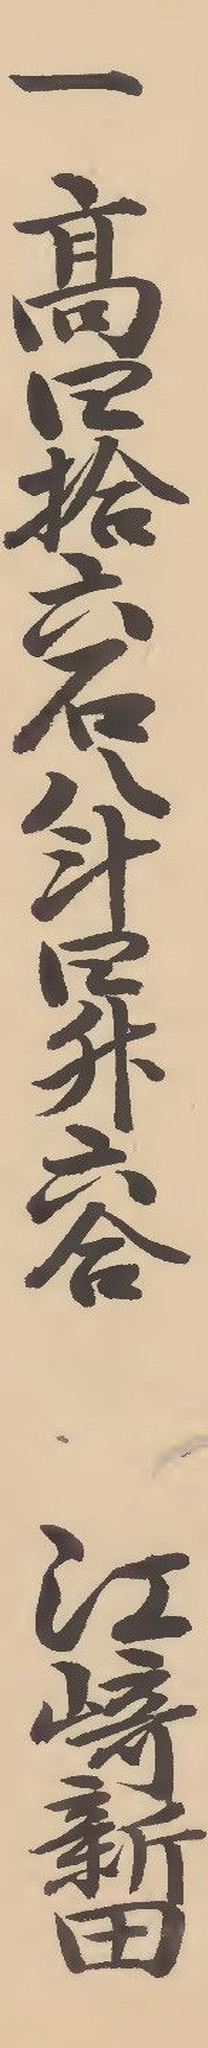一高四拾六石八斗四升六合江崎新田
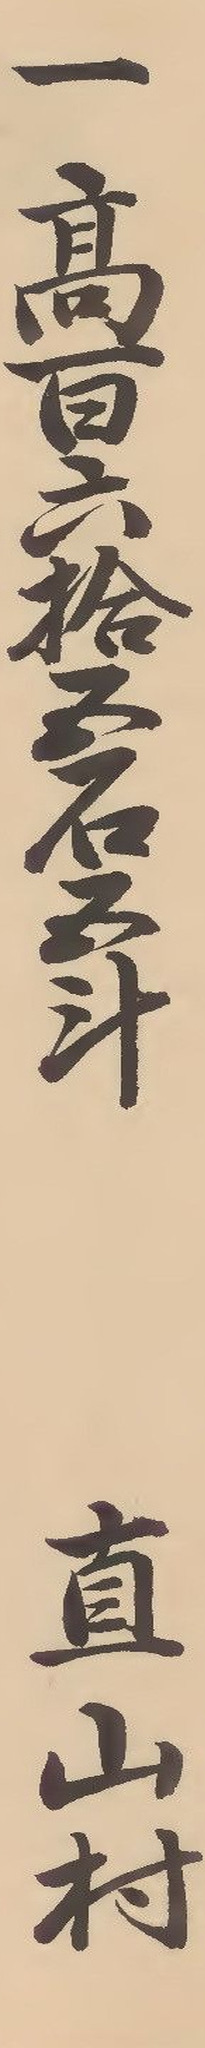一高百六拾五石五斗直山村
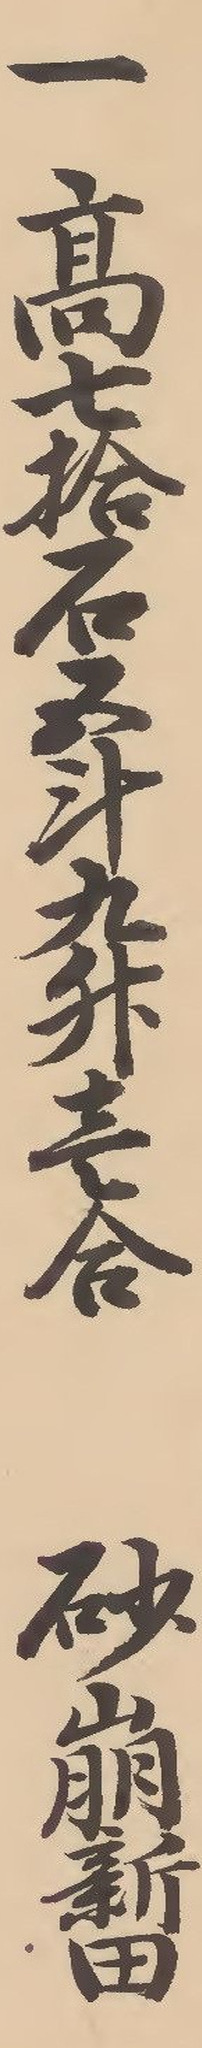一高七拾石五斗九升壱合砂崩新田
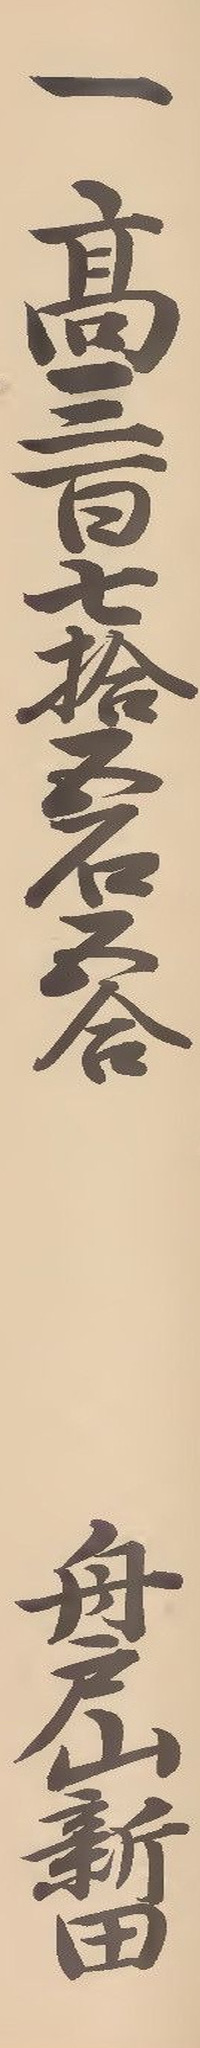一高三百七拾五石五合舟戸山新田
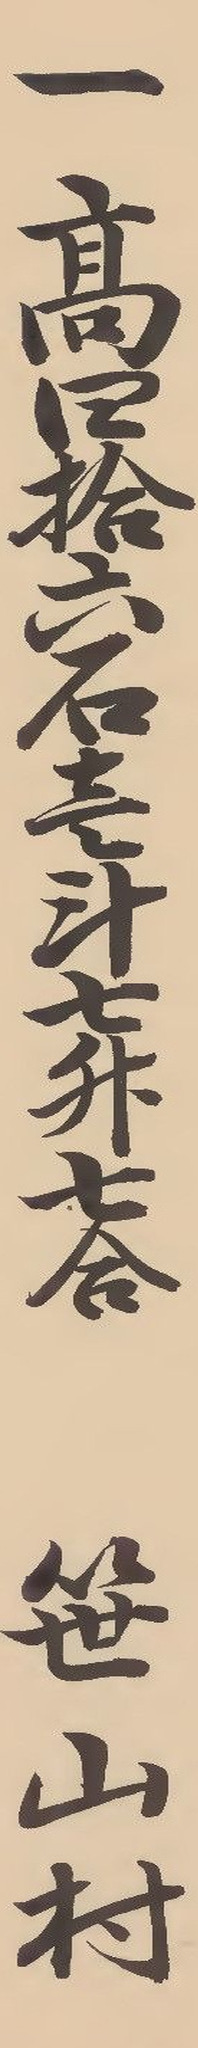一高四拾六石壱斗七升七合笹山村
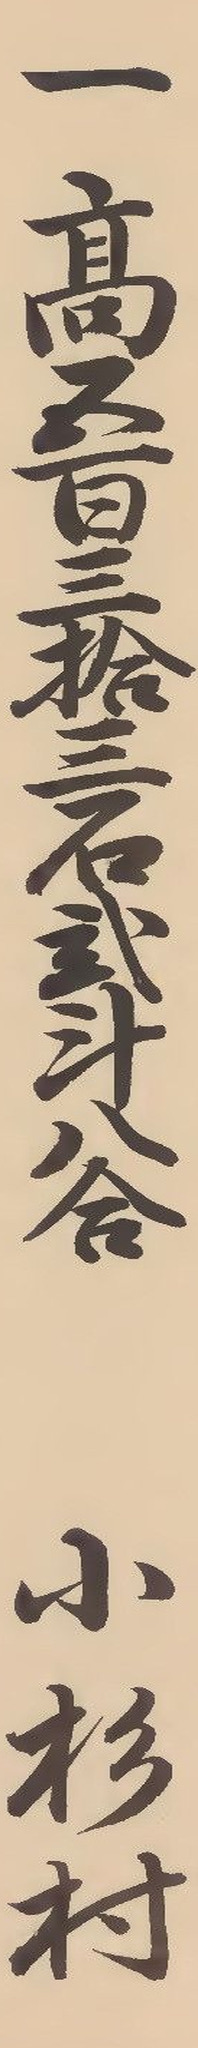一高五百三拾三石弐斗八合小杉村
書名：越後国郷帳　下
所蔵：国立公文書館 National Archives of Japan
